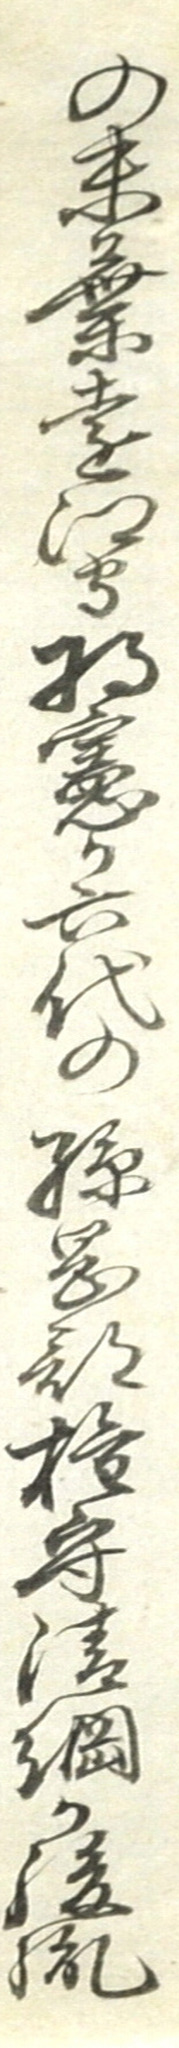の末葉遠江守将憲か六代の孫岡部権守清綱か後胤
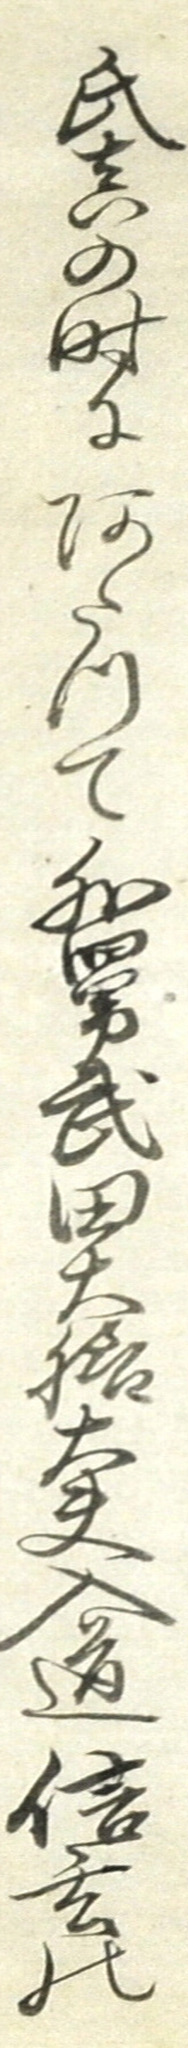氏真の時にあたつて外舅武田大膳大夫入道信玄の
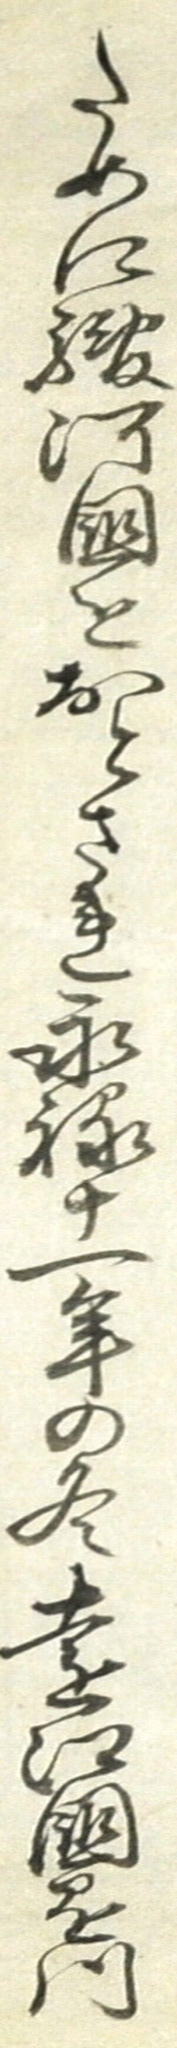ために駿河国をおとされ永禄十一年の冬遠江国懸川
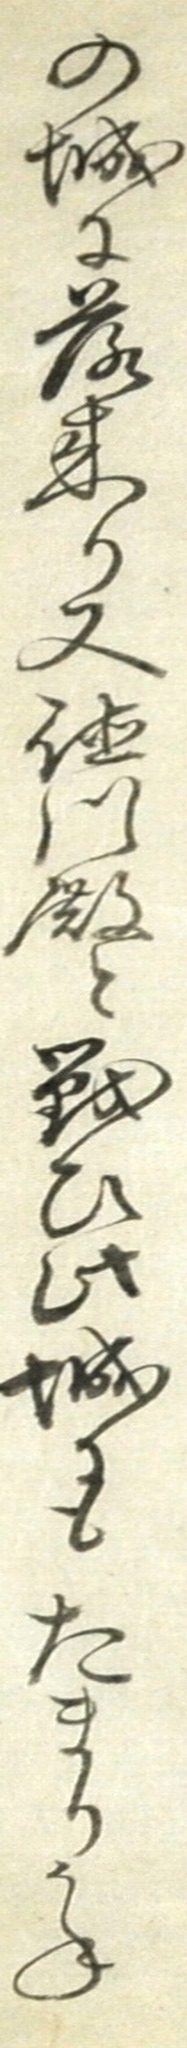の城に落来り又徳川殿と戦ひ此城にもたまりかね
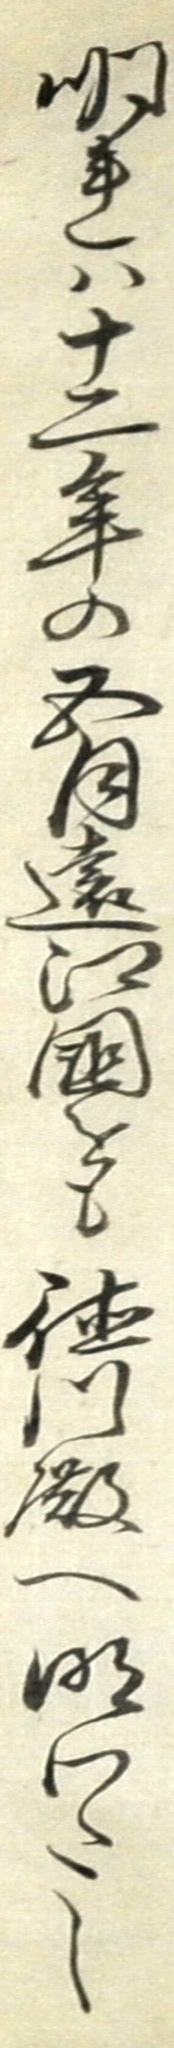明れは十二年の五月遠江国をも徳川殿へ明わたし
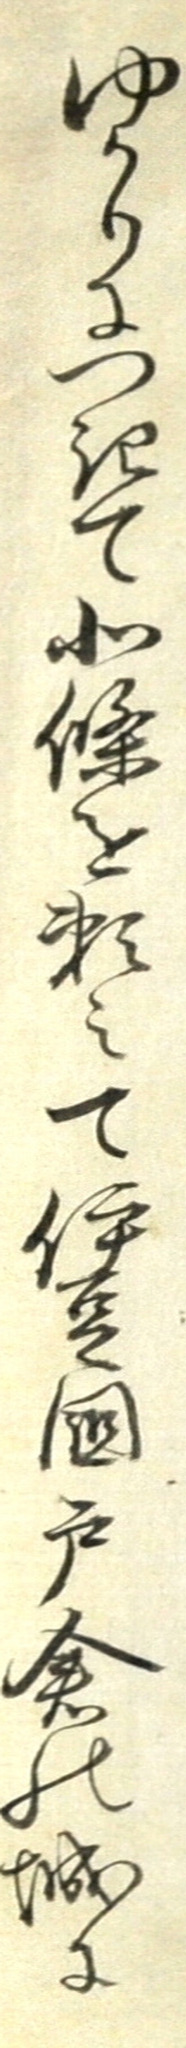ゆかりにつきて北条を頼みて伊豆国戸倉の城に

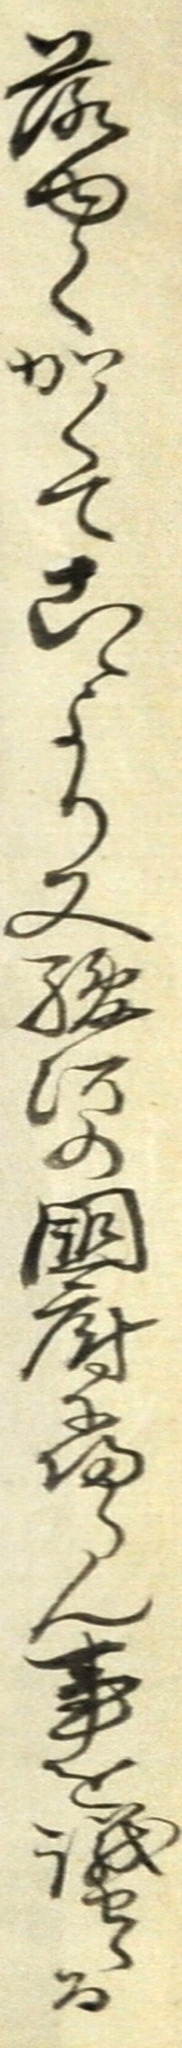落ゆくかくてこゝより又駿河の国府に帰らん事を議せらる
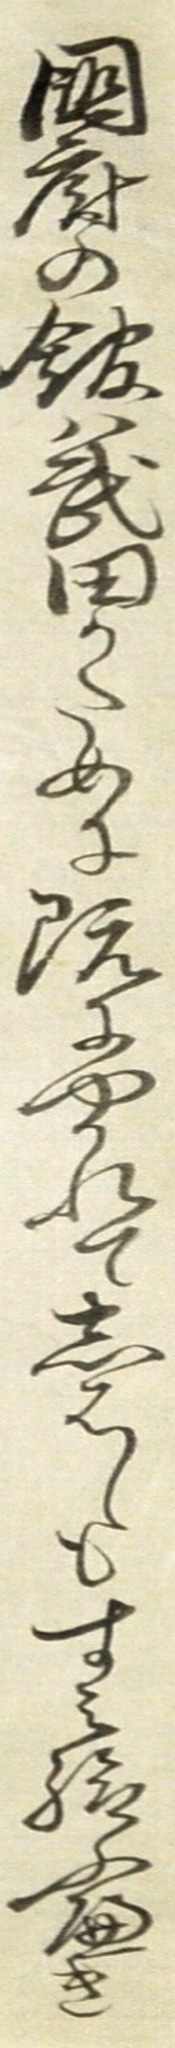国府の館は武田かために既にやかれてしはしもすみ給ふへき
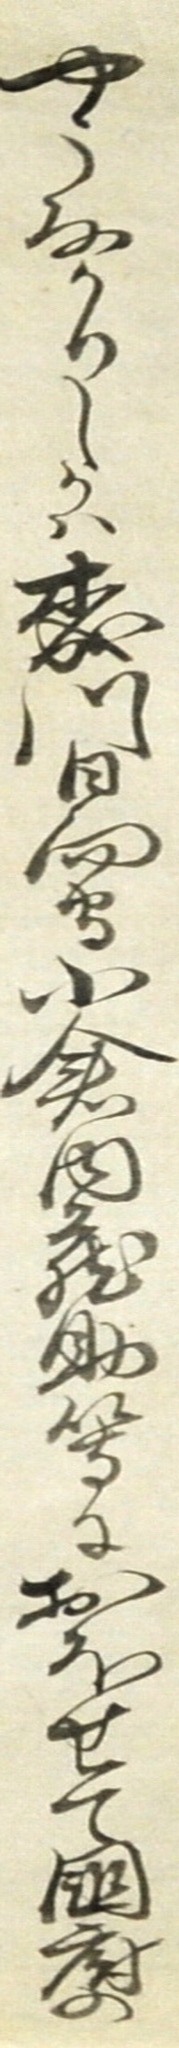やうなかりしかは森川日向守小倉内蔵助等におほせて国府の
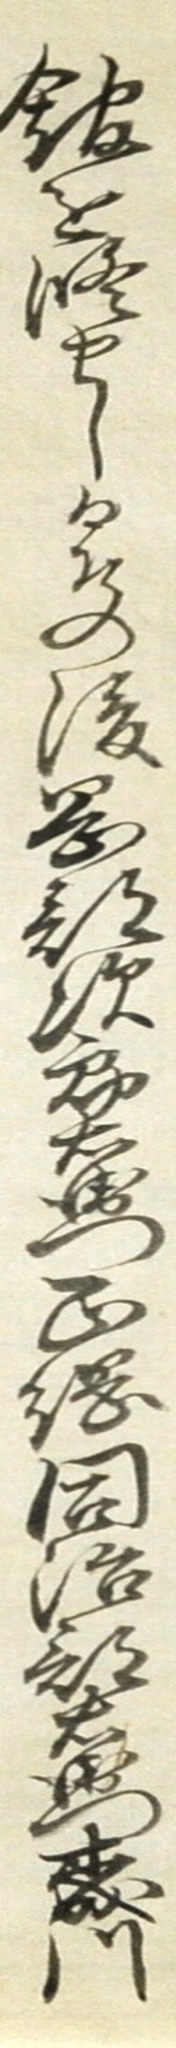館を修せしかその後岡部次郎右衛門正綱同治部右衛門森川
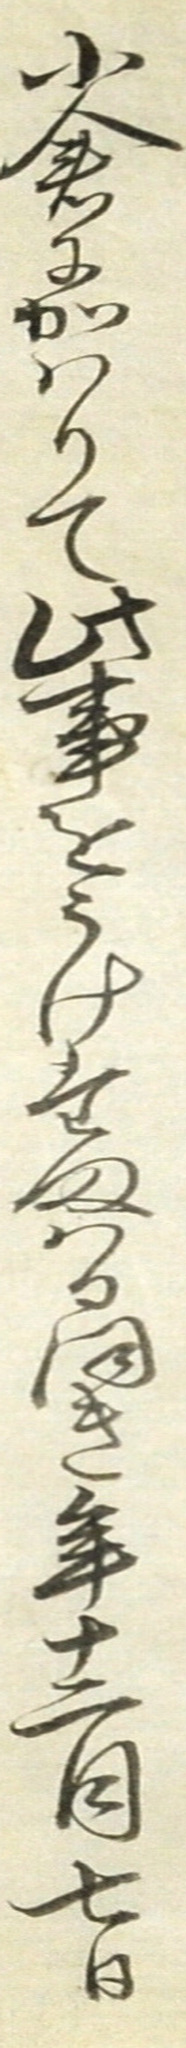小倉にかはりて此事をうけたまはる同き年十二月七日
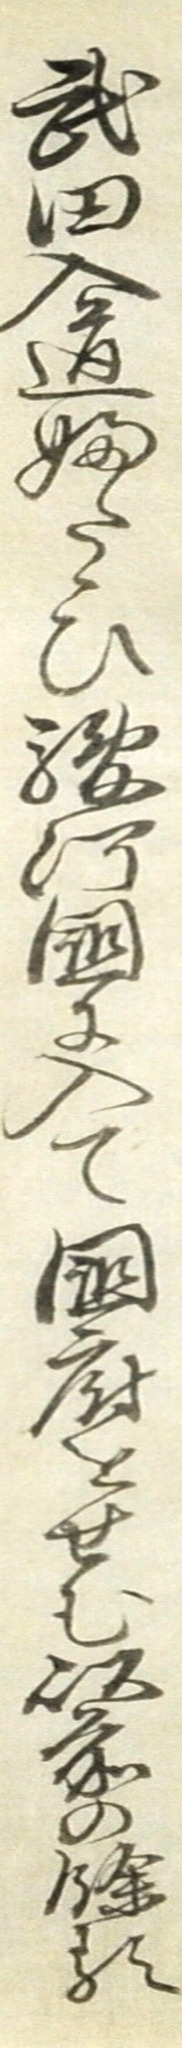武田入道ふたゝひ駿河国に入て国府をせむ以前のよる
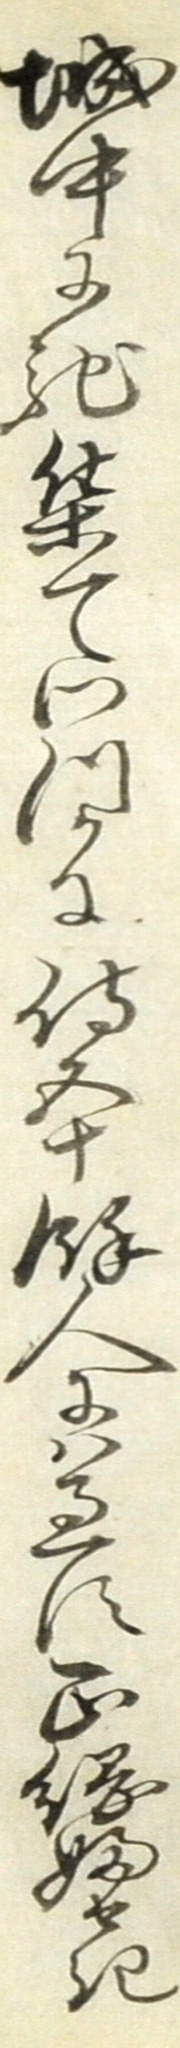城中に馳集てわつかに侍五十余人には過す正綱ふせき
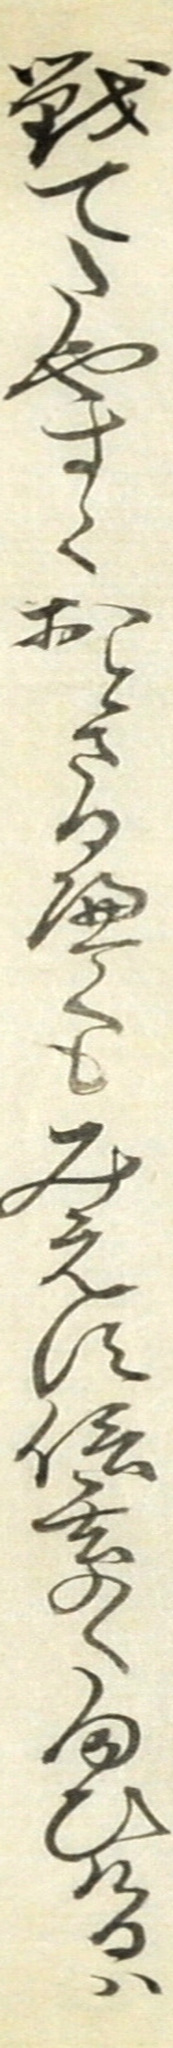戦てたやすくおとさるへくもみえす信玄のたまひけるは
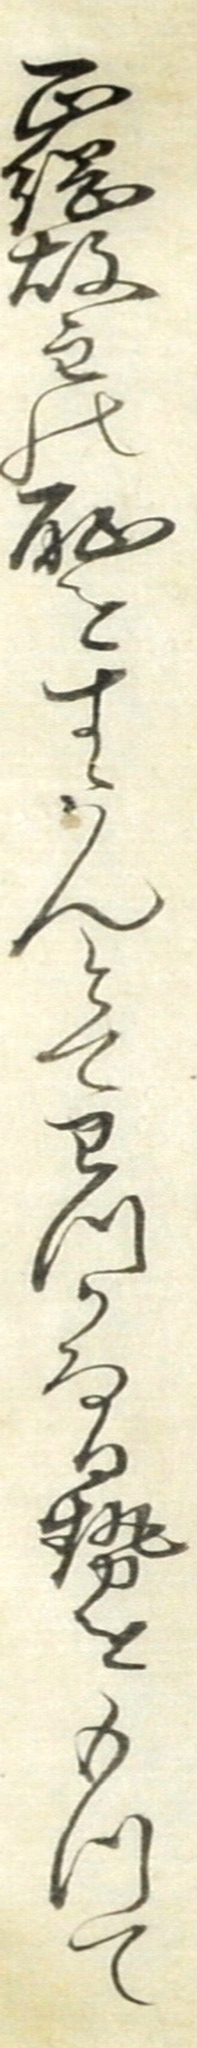正綱故主の恥をすゝかんとてわつかなる勢をもつて
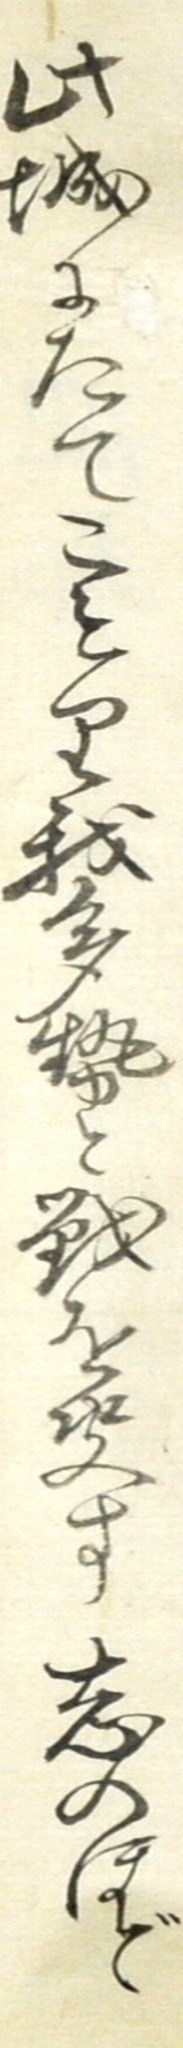此城にたてこもり我多勢と戦を決す志のほど
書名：藩翰譜（六）
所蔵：伊那市立高遠町図書館・合同会社AMANE
